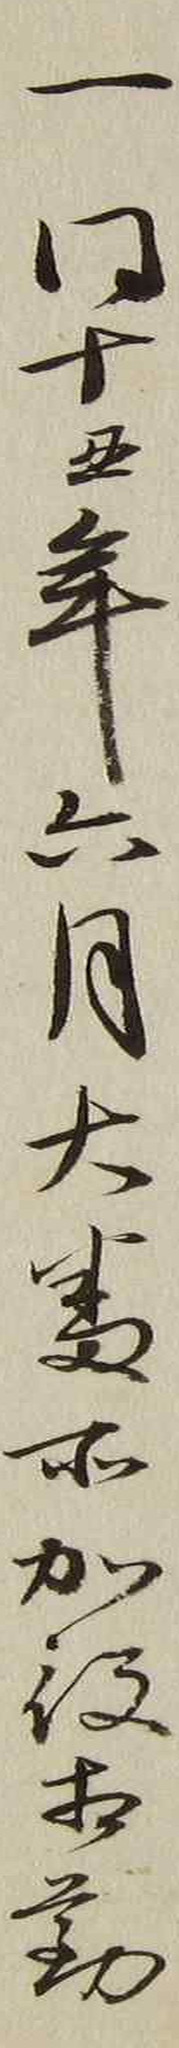一同十丑年六月大番所加役相勤
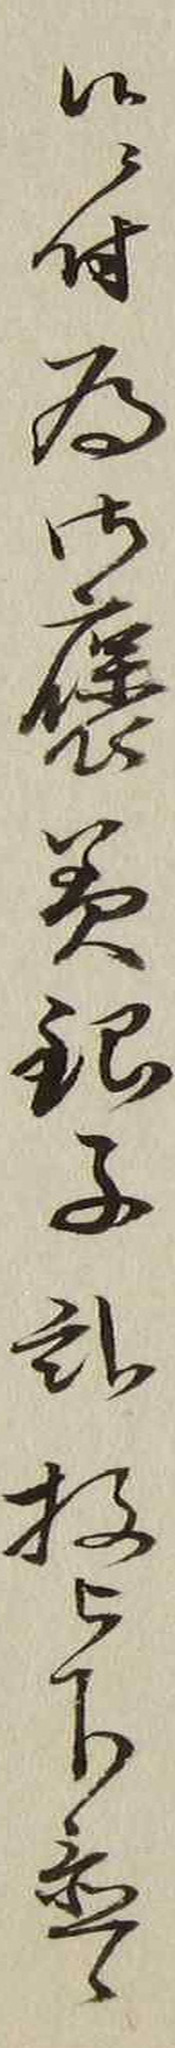候付為御褒美銀子弐枚被下置候
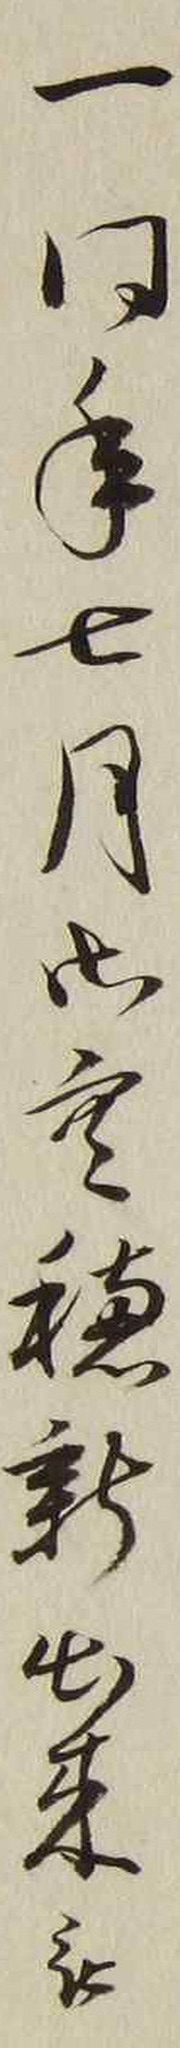一同年七月御空穂新出来被
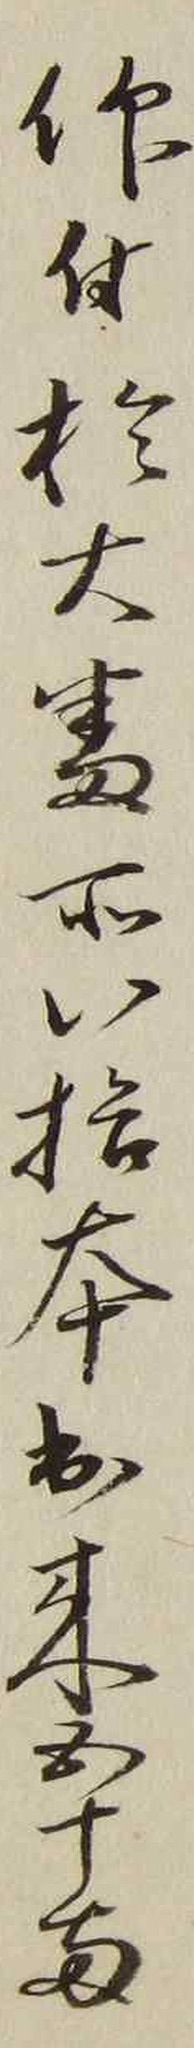仰付於大番所八拾本出来五十両

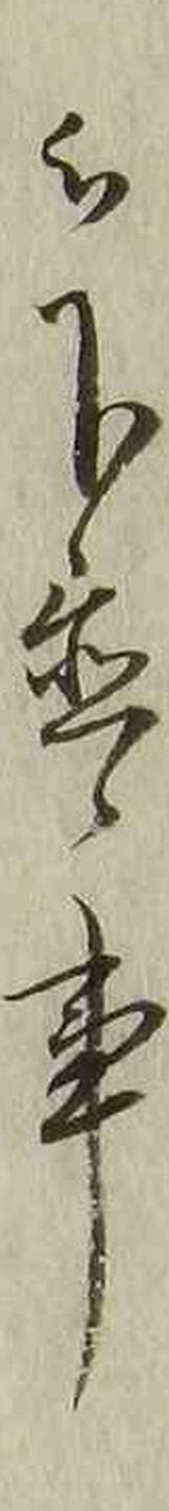被下置候事
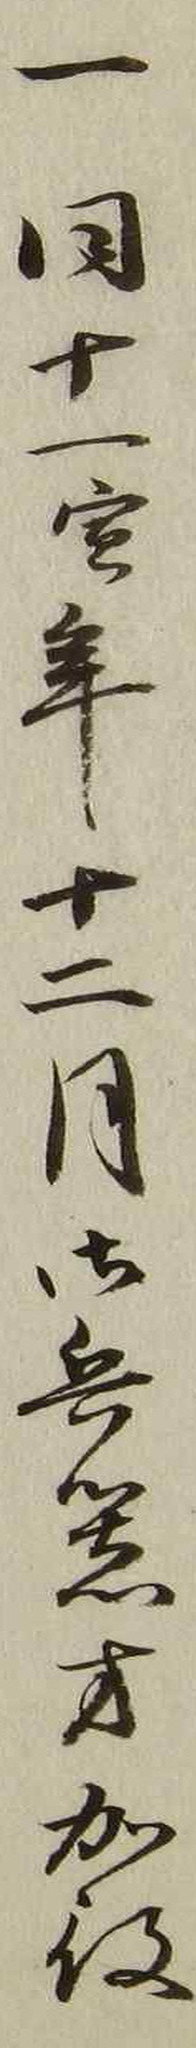一同十一寅年十二月御兵器方加役
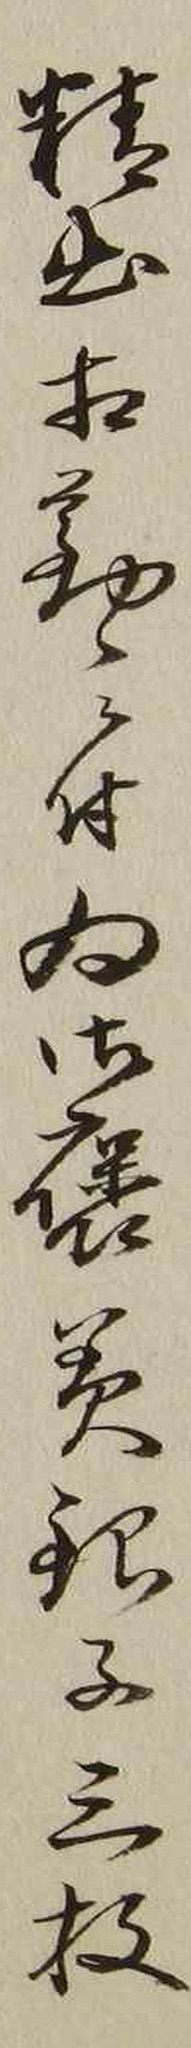精出相勤候付為御褒美銀子三枚
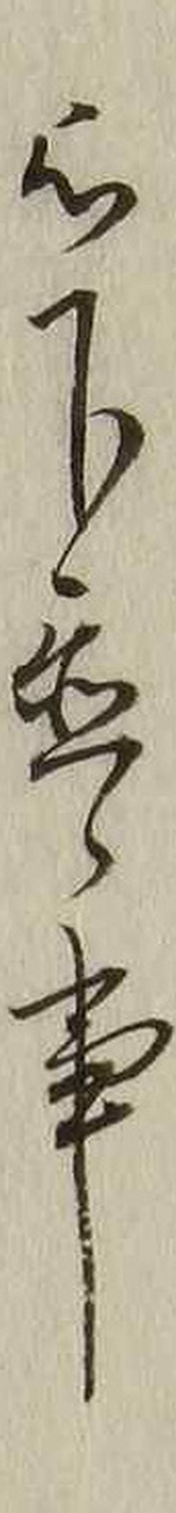被下置候事
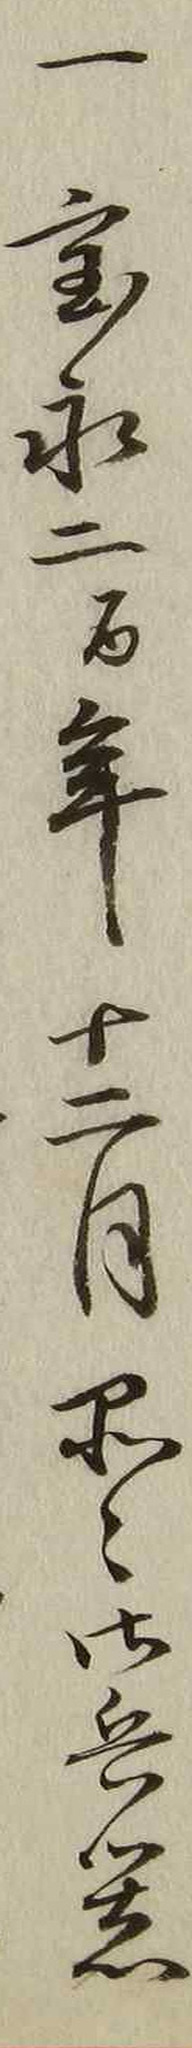一宝永二酉年十二月品々御兵器
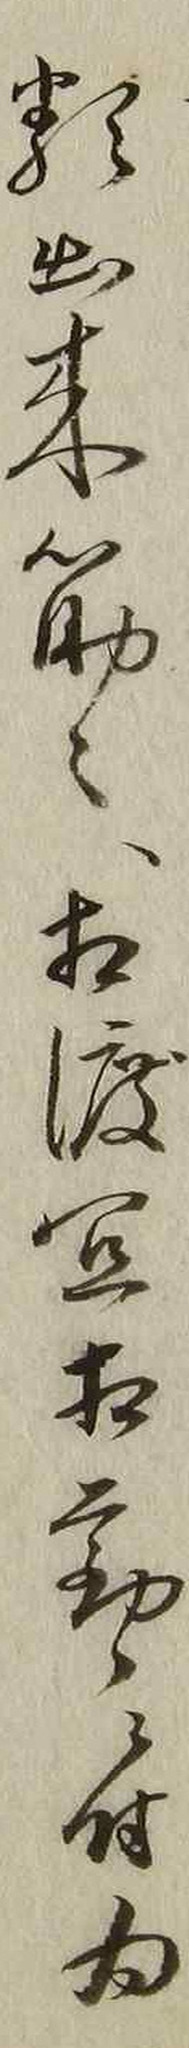類出来筋々相渡宜相勤候付為
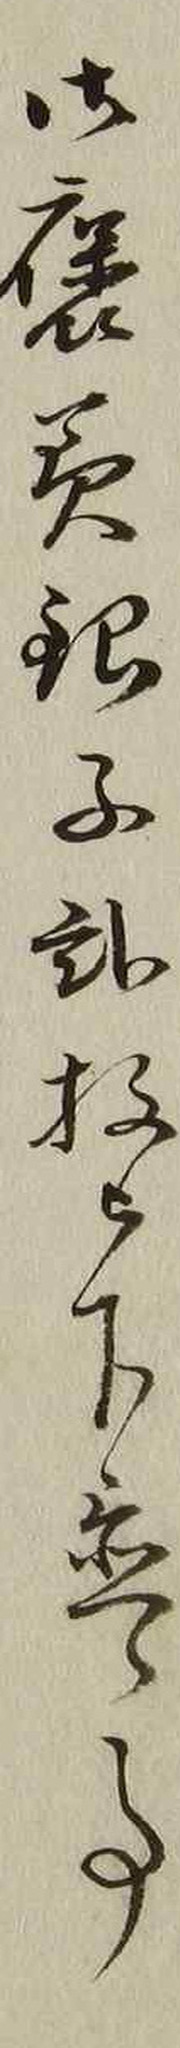御褒美銀子弐枚被下置候事
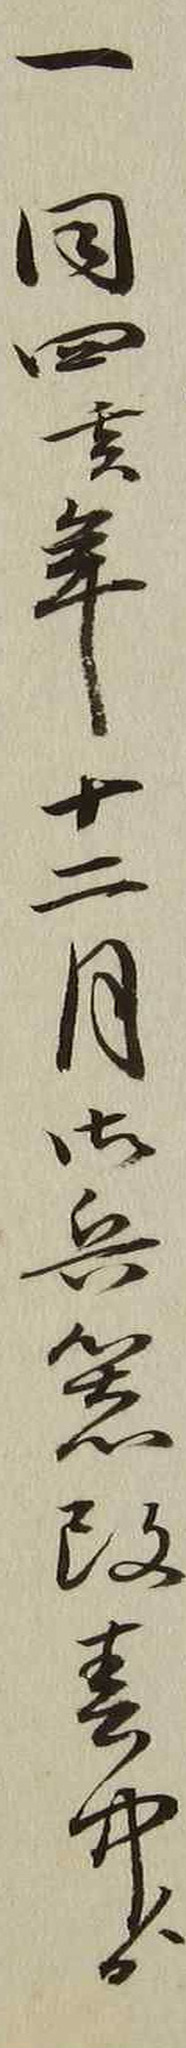一同四亥年十二月御兵器改春中ゟ
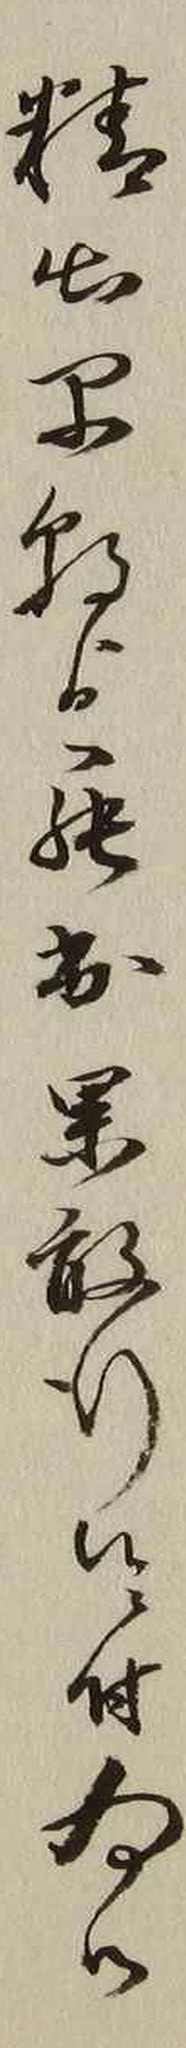精出早朝ゟ罷出果敢行候付為御
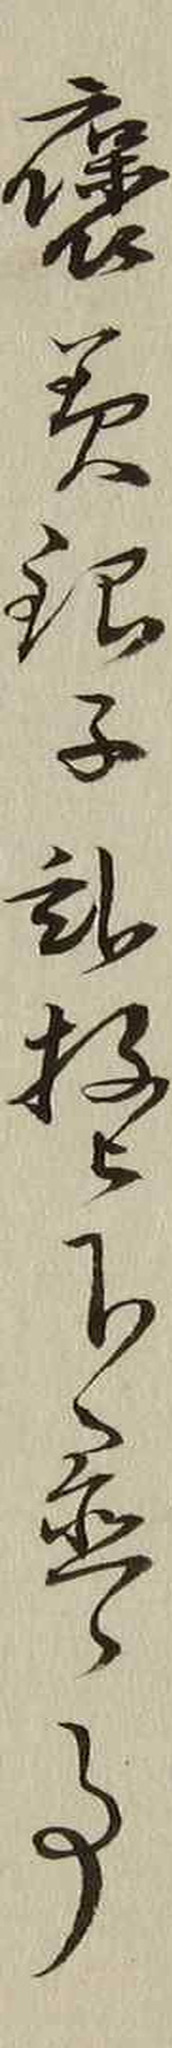褒美銀子弐枚被下置候事
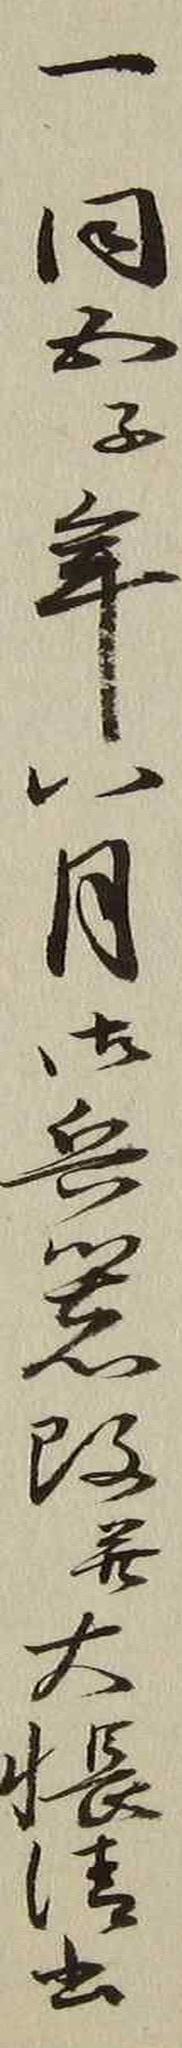一同五子年八月御兵器改幷大帳清書
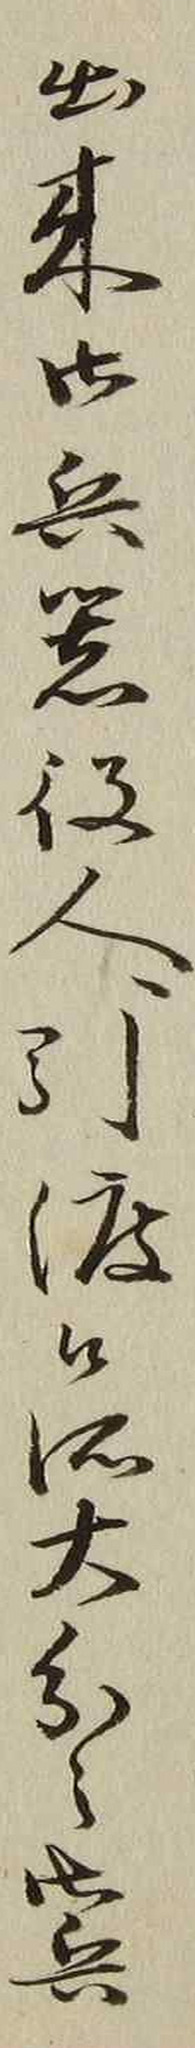出来御兵器役人引渡候所大分之御兵
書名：諸士系譜　巻之102　か之部10
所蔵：会津若松市立会津図書館
